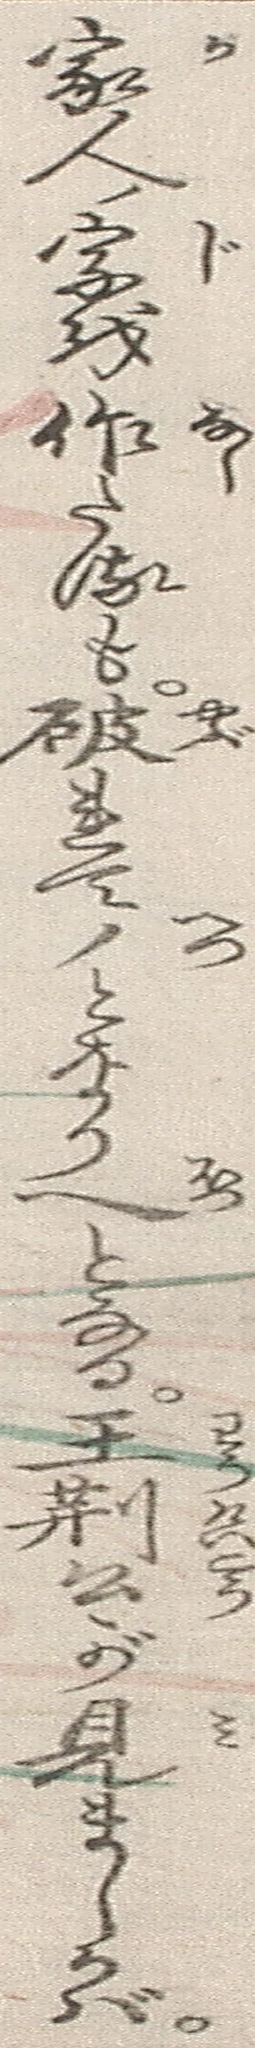家人ノ字を作たるも。破れて丿となり乀となる。王荊公が見ましかバ。
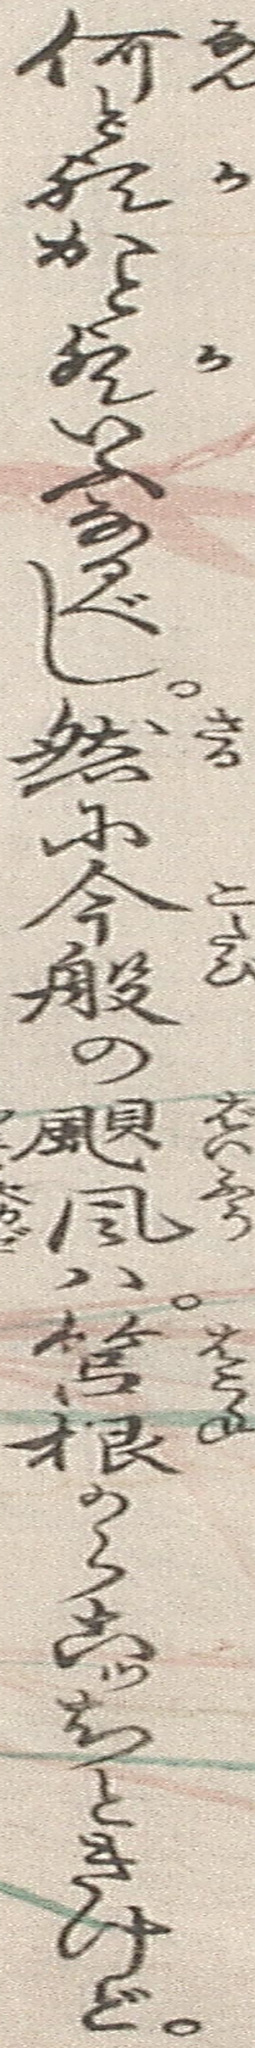何と歟かと歟いふなるべし。然に今般の颶風ハ。筥根からこッちときけど。
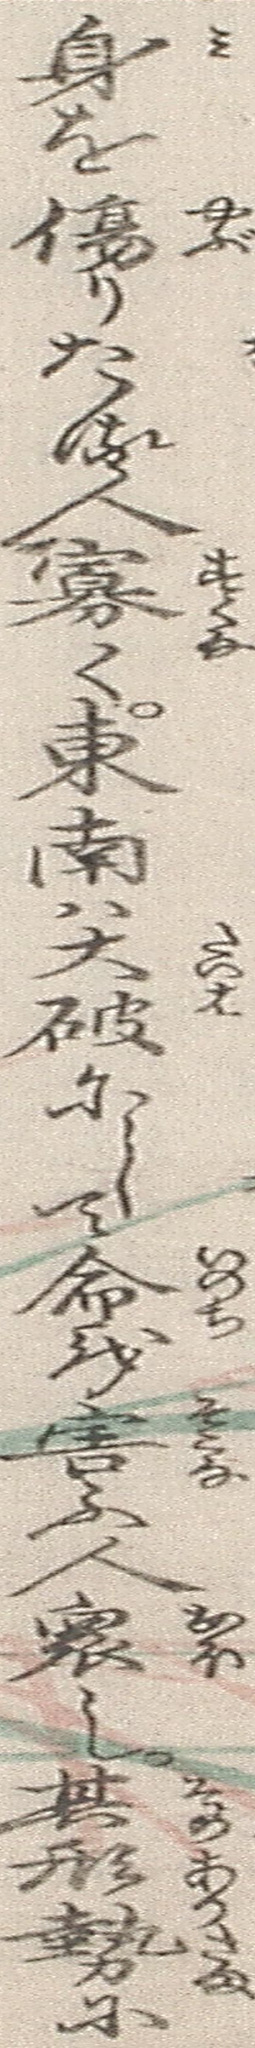身を傷りたる人寡く。東南ハ大破にして命を害ふ人衆し。其形勢に
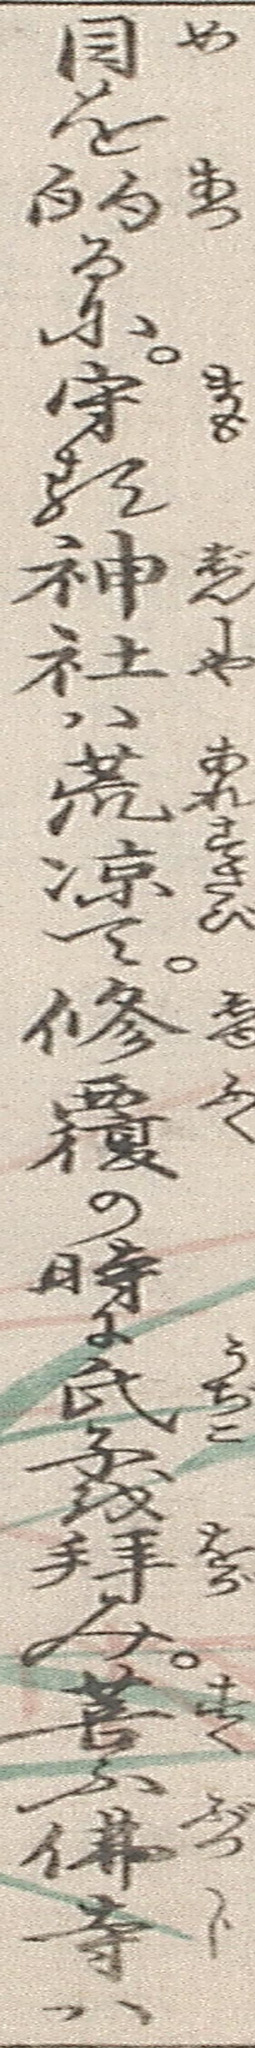目を的るに。守る神社ハ荒凉て。修覆の時に氏子を拝み。菩ふ仏寺ハ
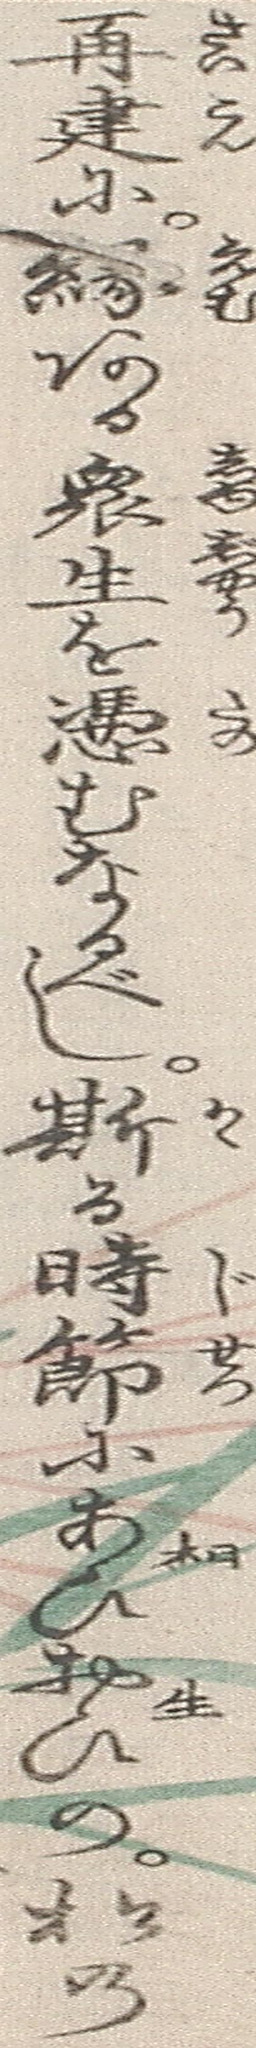再建に。縁ある衆生を憑むなるべし。斯る時節にあひおひ相生の。松の
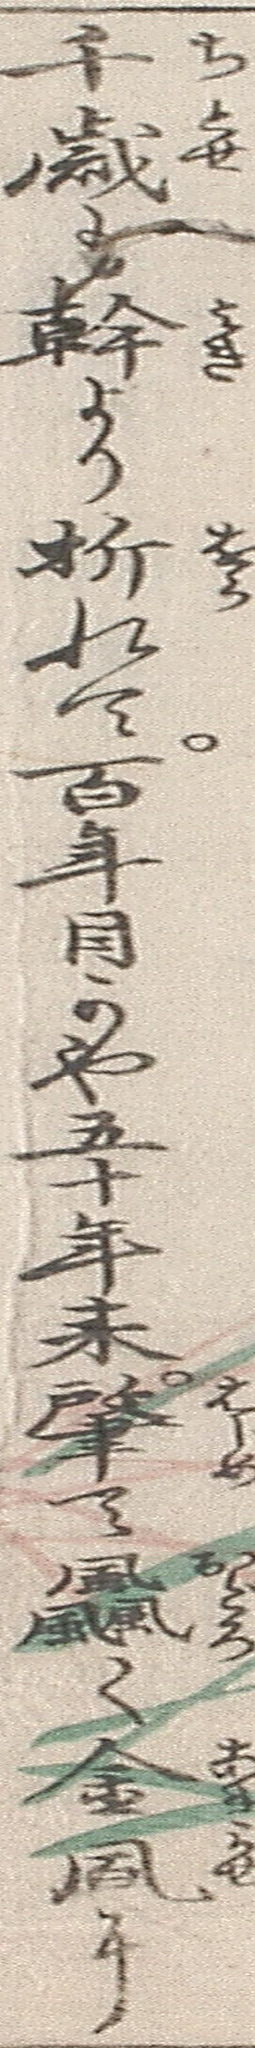千歳も幹より折れて。百年目かや五十年来。肇て飍く金風に
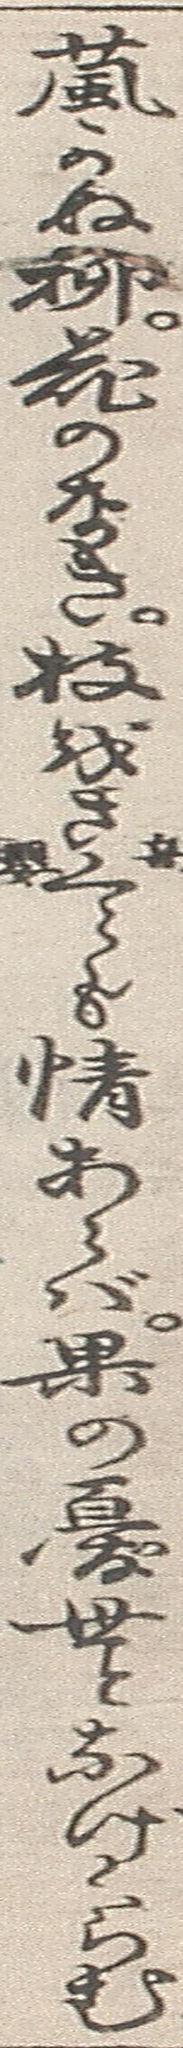葻かぬ柳。花のなき。枝をさく剖らも情あらバ。果の憂世となげくらむ。
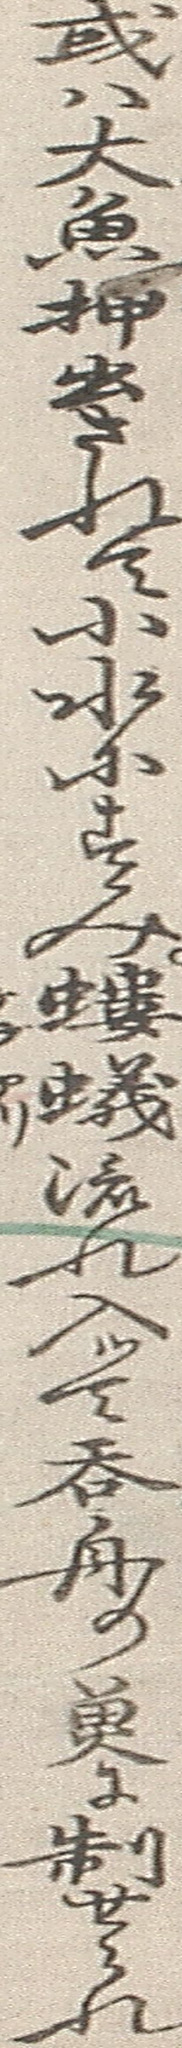或ハ大魚押出されて小水にすみ。螻蟻流れ入ッて呑舟の魚に制せられ。
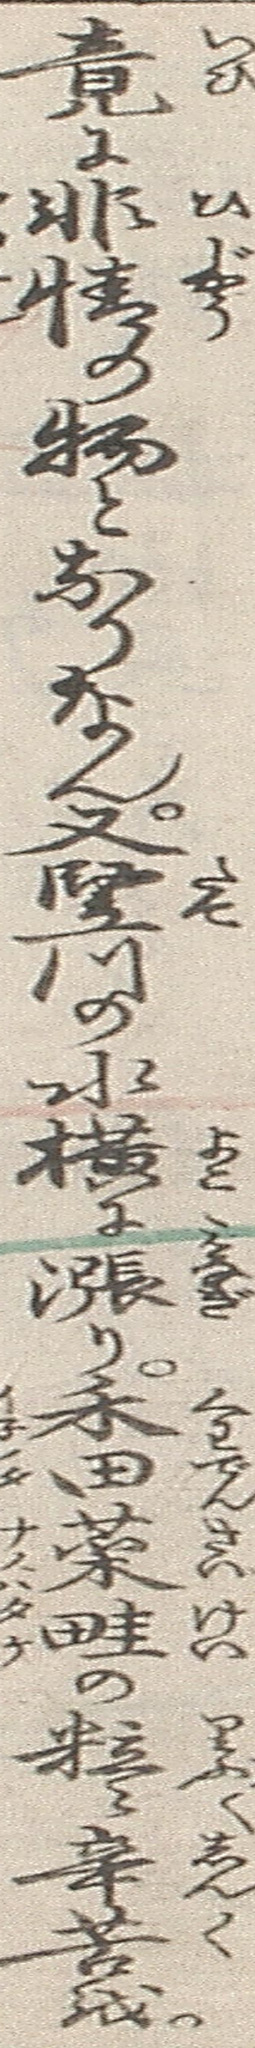竟に非情の物となりなん。又竪川の水横に漲り。禾田菜畦の粒々辛苦を。
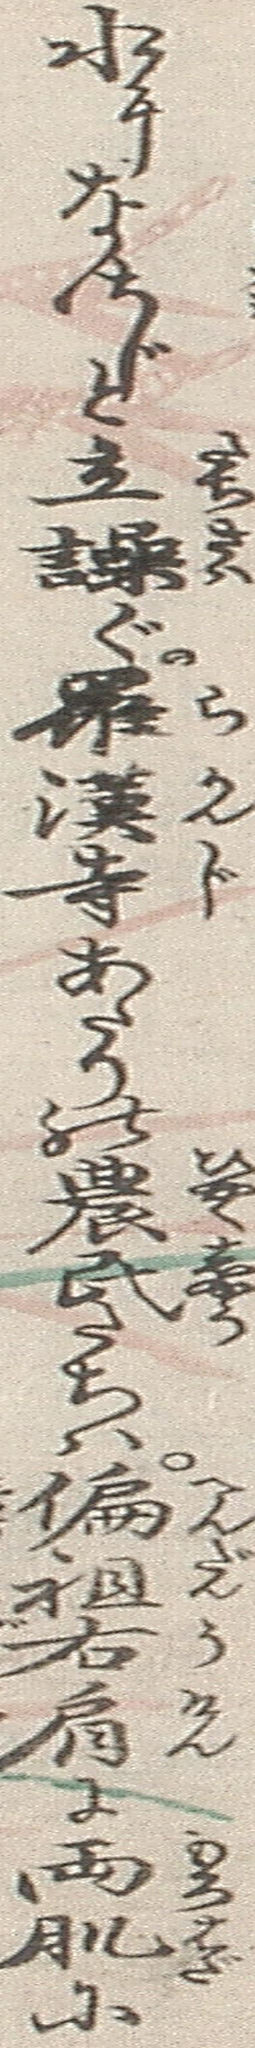水になさじと立譟ぐ。羅漢寺あたりの農民たちハ偏袒右肩に両肌に
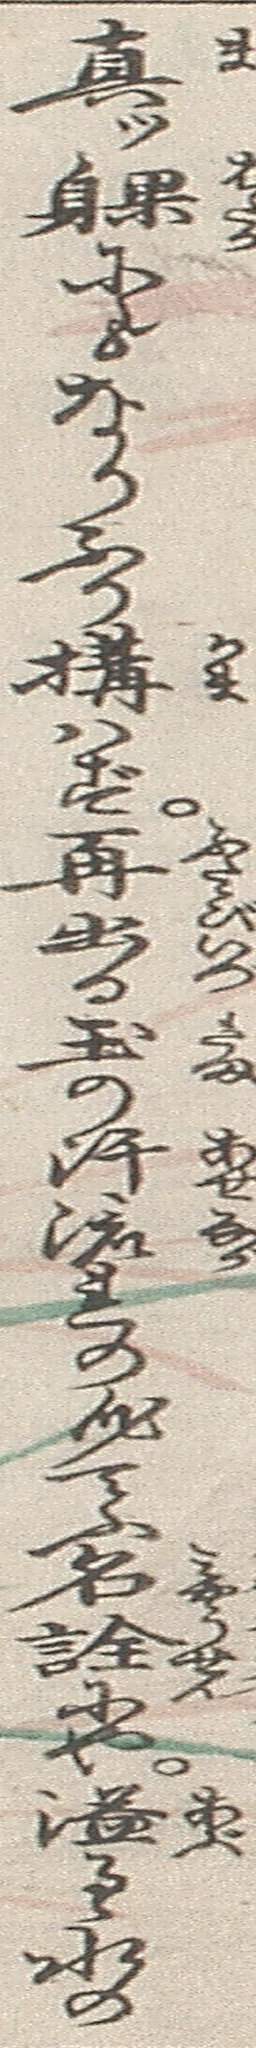真ッ躶にもなりふり構ハず。再出る玉の汗流れの身てふ名詮にや。溢るゝ水の
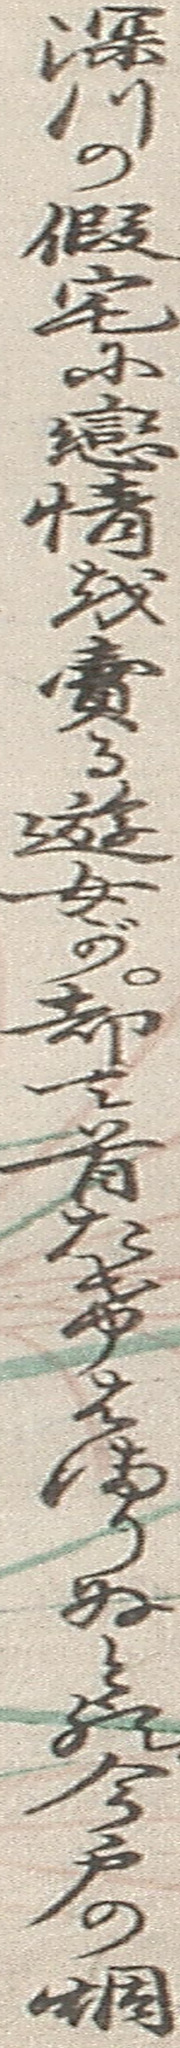深川の假宅に。恋情を売る遊女が。却て首たけはまりぬと歟。今戸の烟
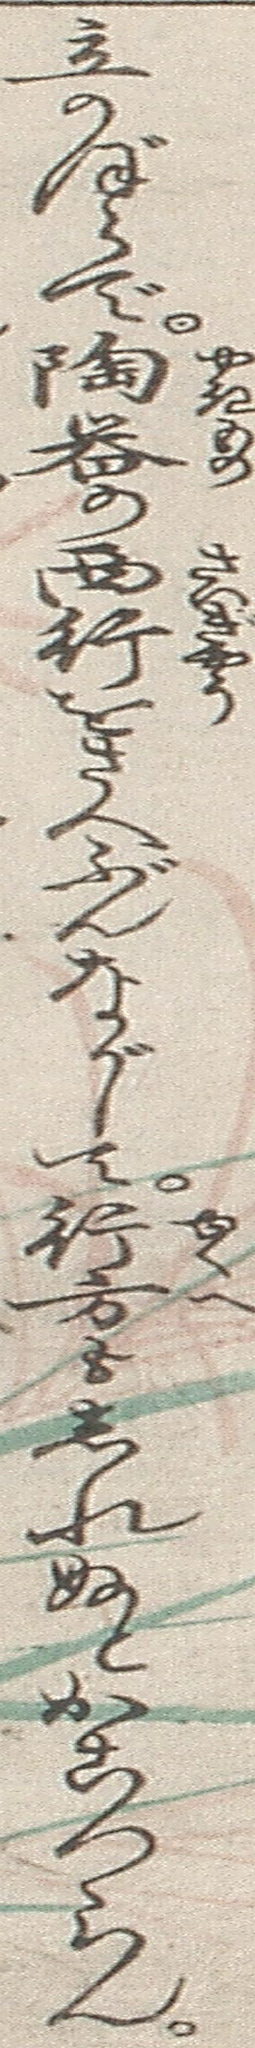立のぼらで。陶器の西行をさへぶんながして。行方もしれぬとかこつらん。
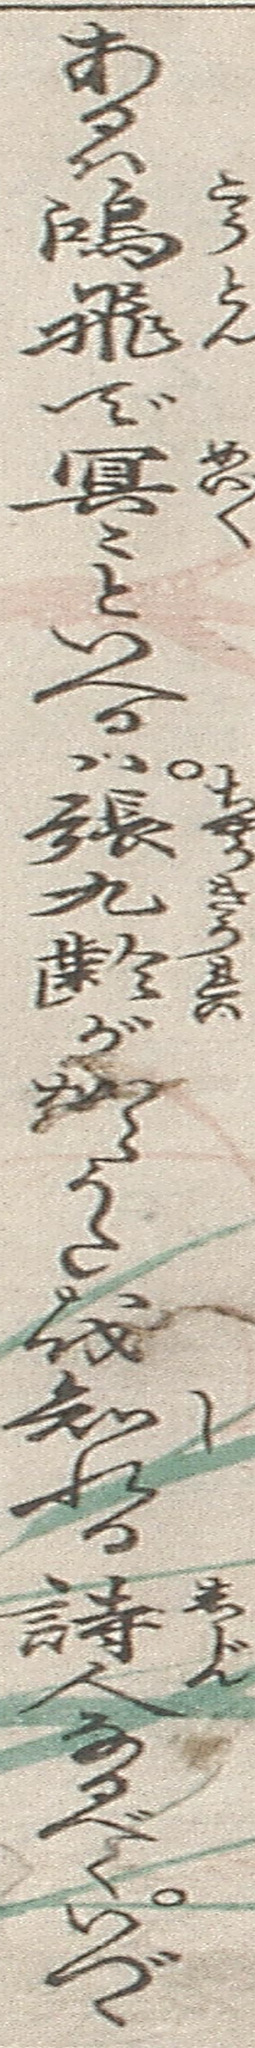あるハ鴻飛で冥々といへるハ。張九齢がかゝるうたを知れる詩人なるべく。いづゝ
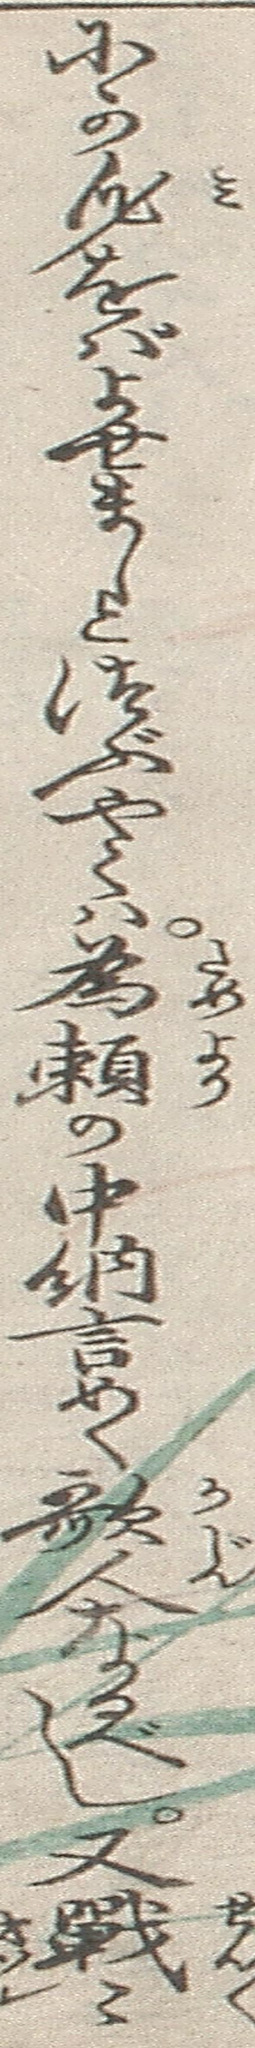にか身をばよせましとつぶやくハ。為頼の中納言めく歌人なるべし。又戦々
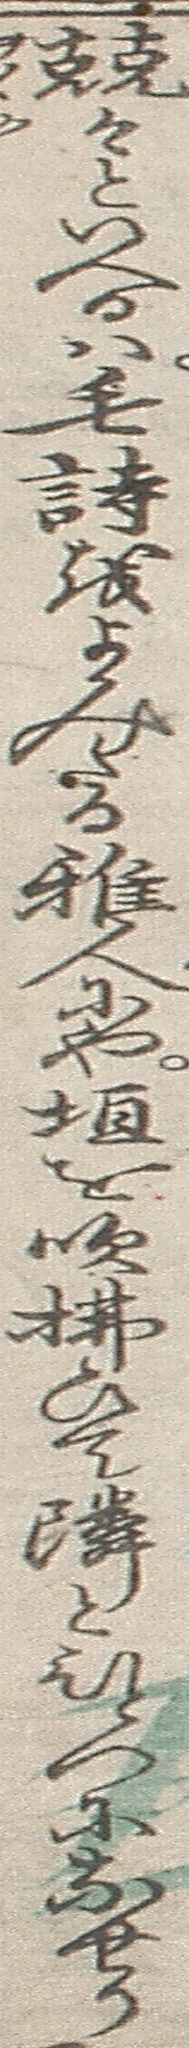競々といへるハ。毛詩をよみたる雅人にや。垣を吹払ひて隣とひとつになせり
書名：安政風聞集　上中下　全
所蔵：東京大学地震研究所図書室 Earthquake Research Institute Library, The University of Tokyo, JAPAN
